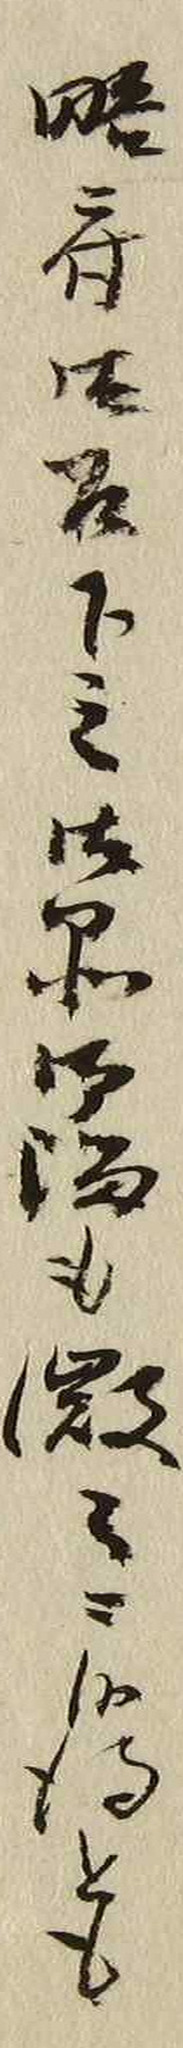略ニ付御召下之御品御溜も微々ニ候得とも
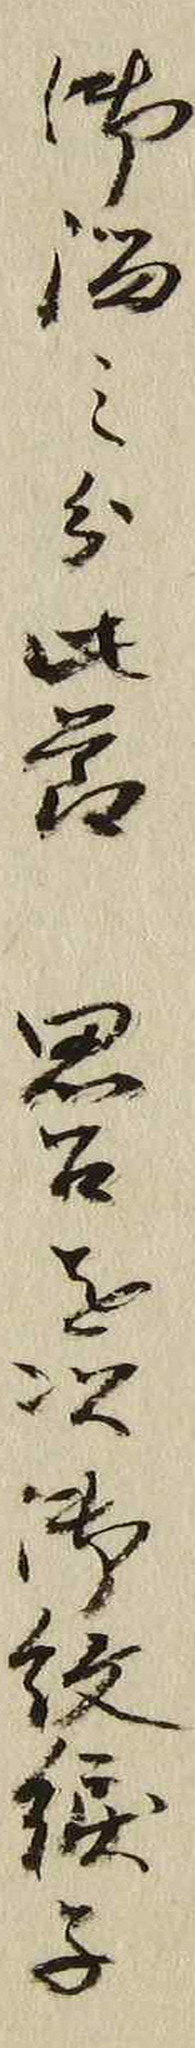御溜之分此節思召を以御紋綟子
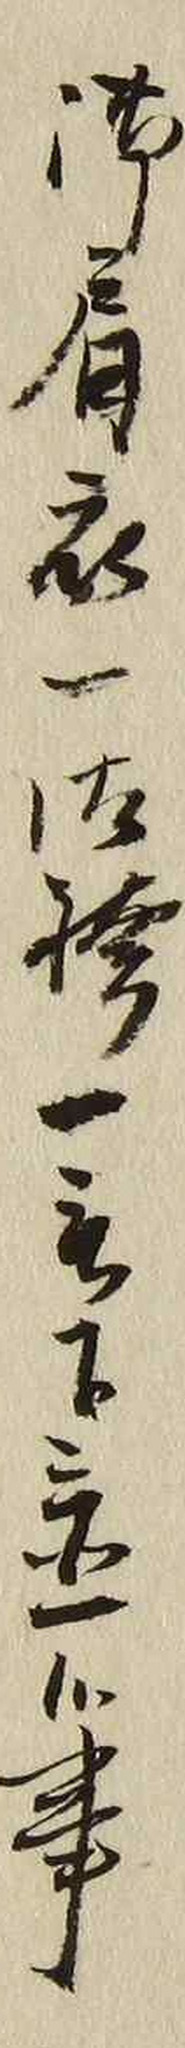御肩衣一御袴一被下置候事
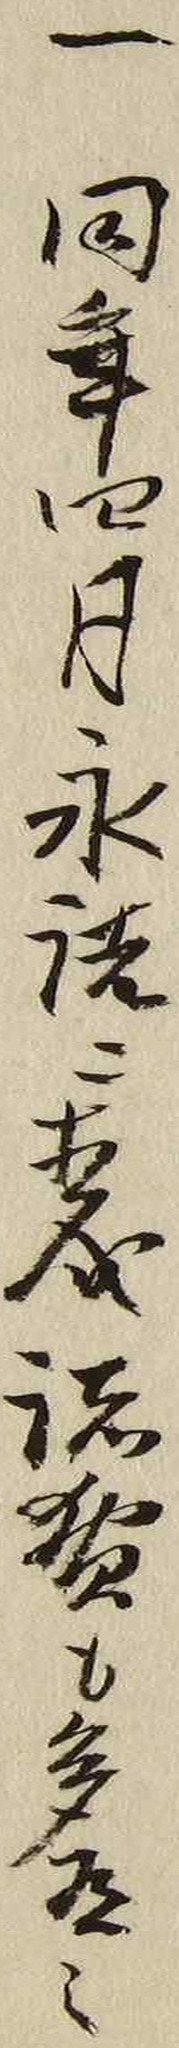一同年四月永詰ニ相成諸費も多有之
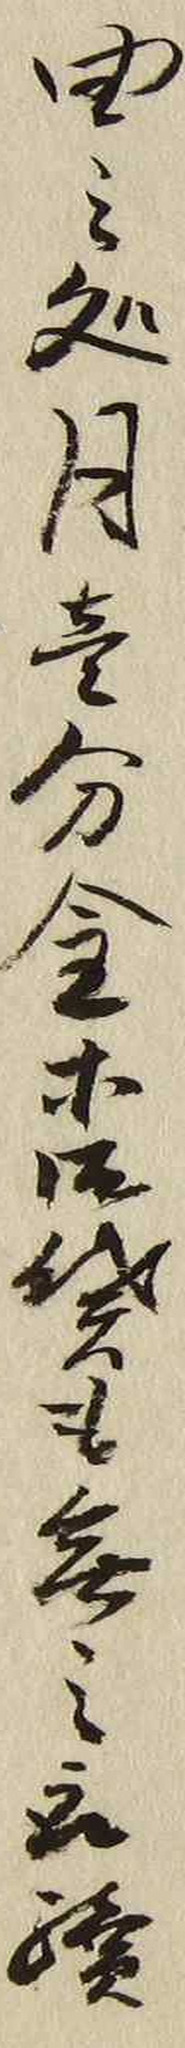由之処月壱分金等御貸も無之取続
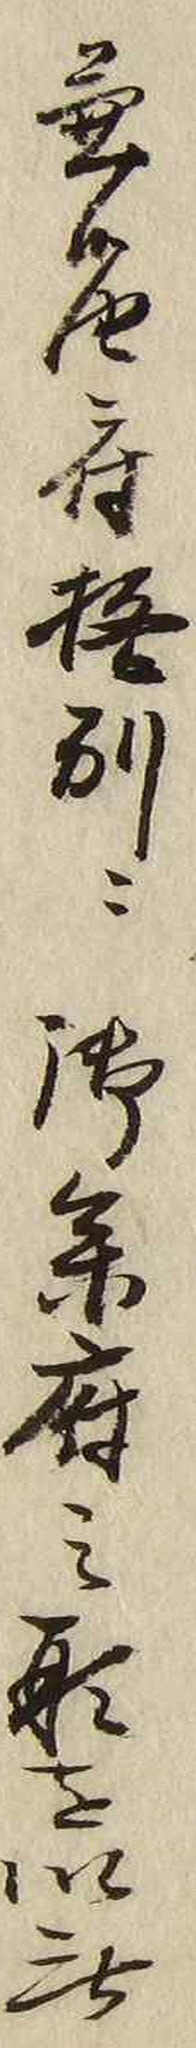兼候由ニ付格別ニ御参府之形を以無

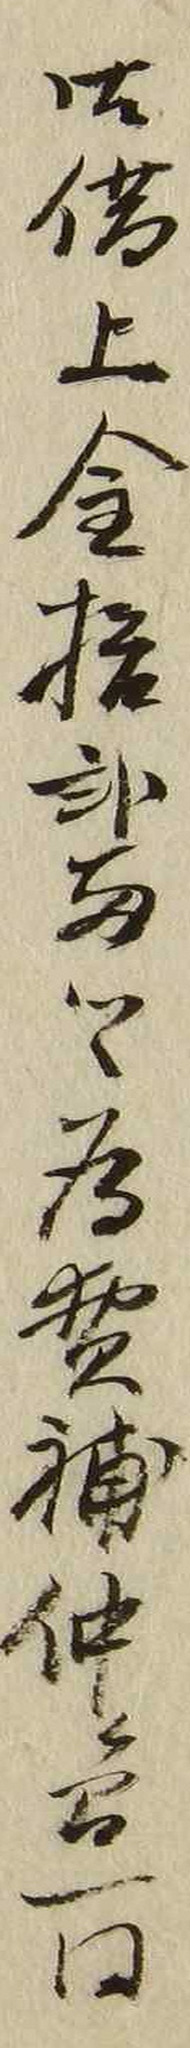御借上金拾弐両ツヽ為費補仲ケ間一同
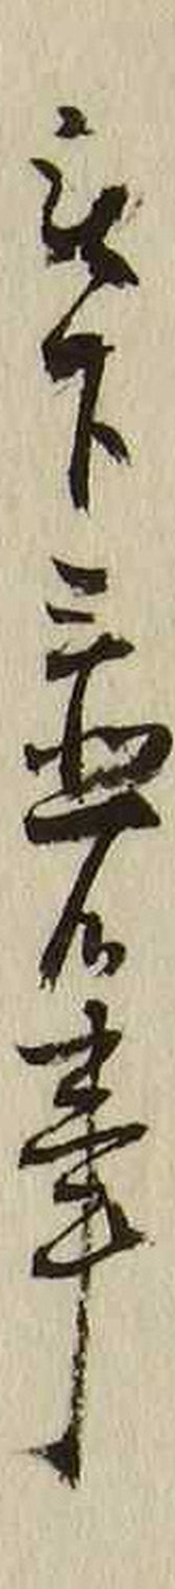被下置候事
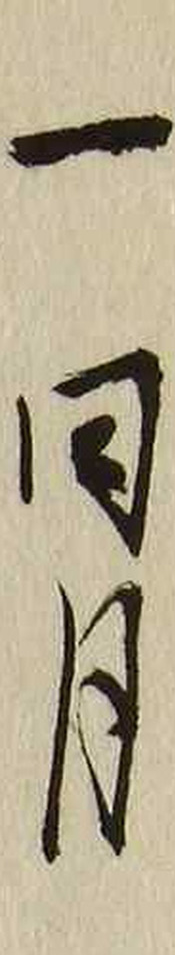一同月
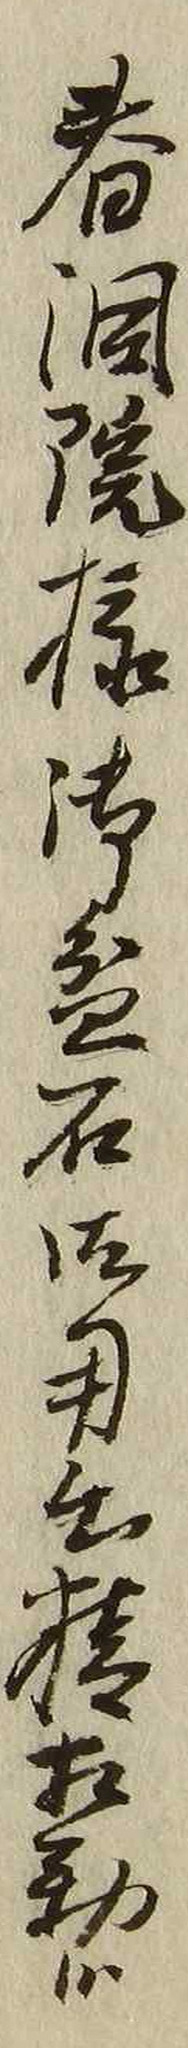春洞院様御盆石御用出精相勤候
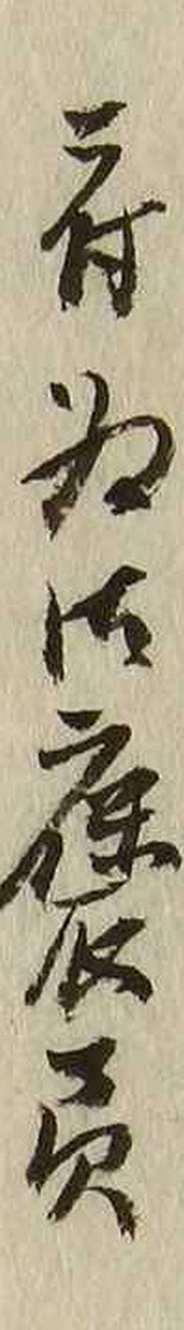ニ付為御褒美
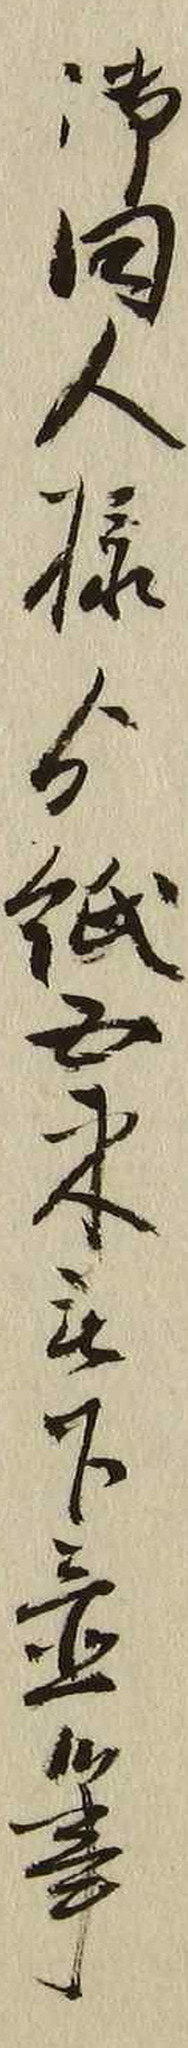御同人様ゟ紙五束被下置候事
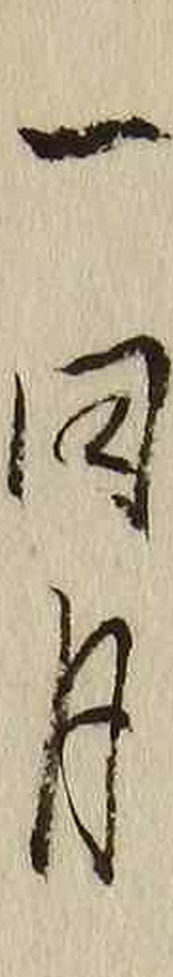一同月
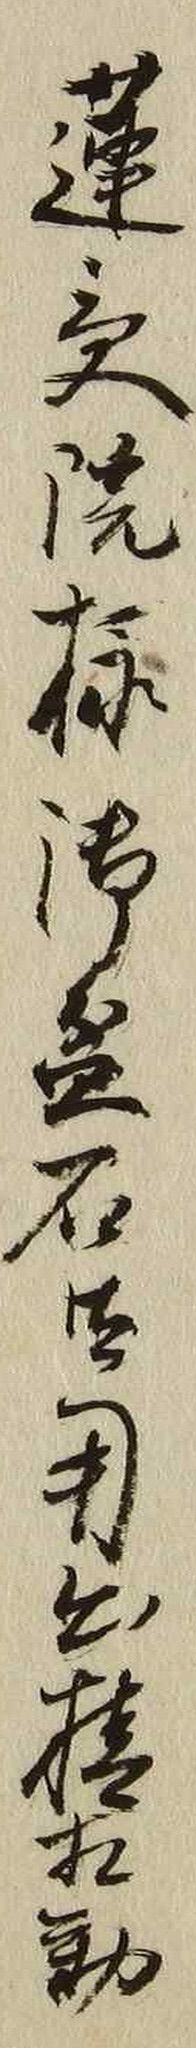蓮受院様御盆石御用出精相勤
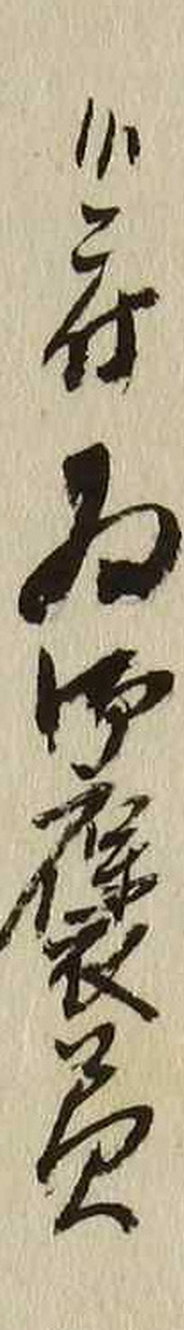候ニ付為御褒美
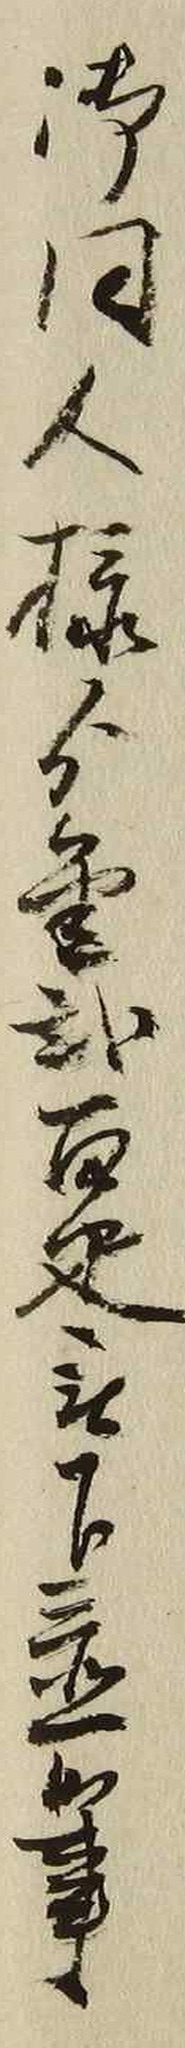御同人様ゟ金弐百疋被下置候事
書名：諸士系譜　巻之345　も之部1
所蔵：会津若松市立会津図書館
